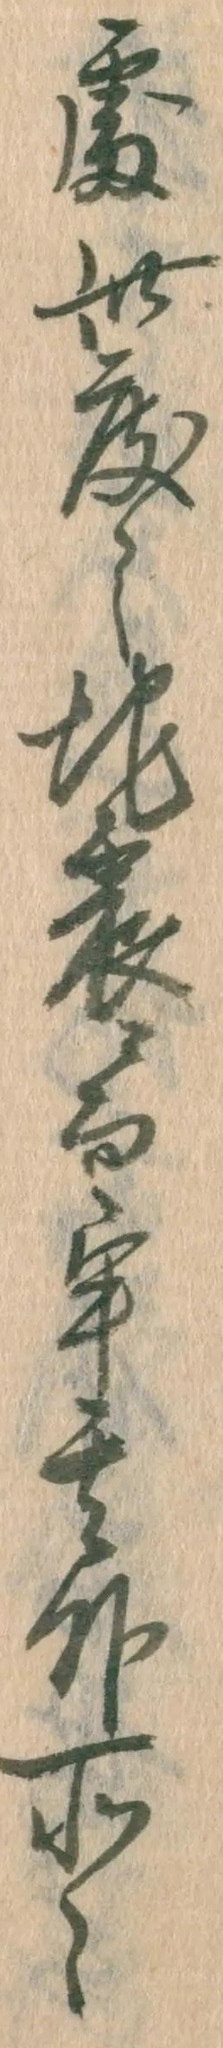処此度之地震ニて牢其外所〻
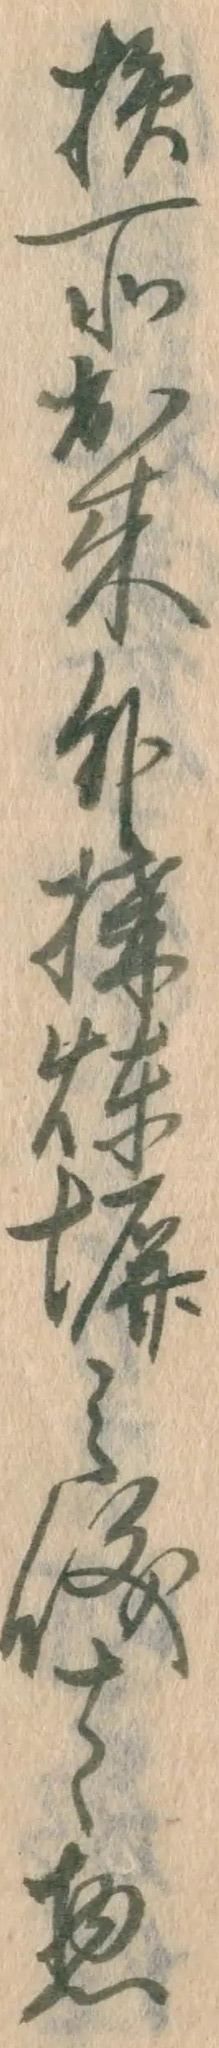損所出来外構煉塀之儀は惣
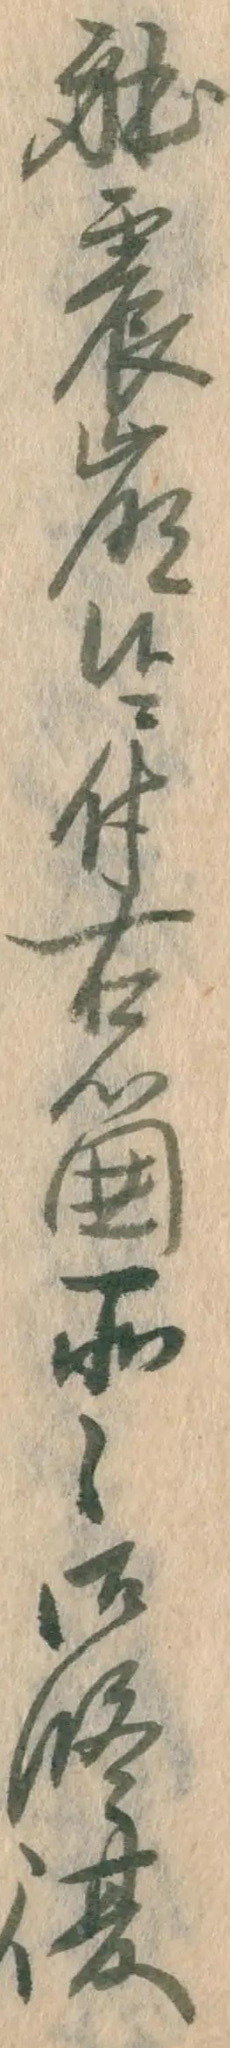体震崩候ニ付右箇所之御修復

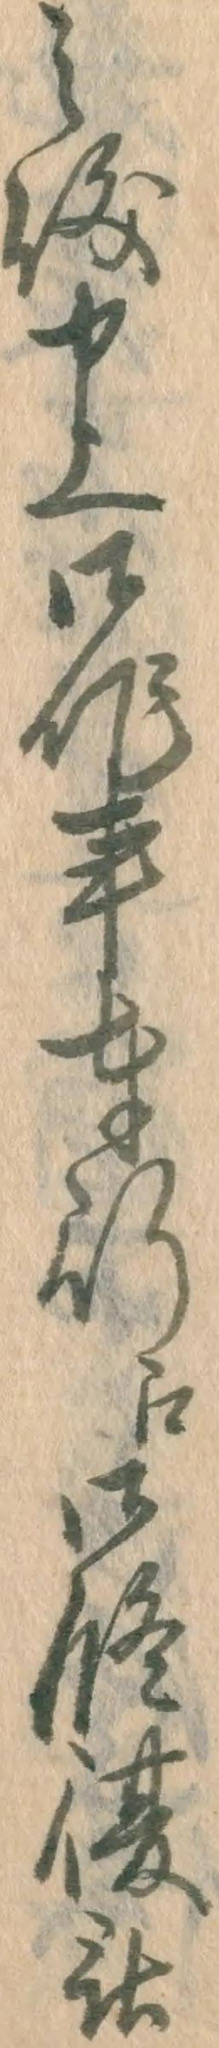之儀申上候作事奉行え御修復被
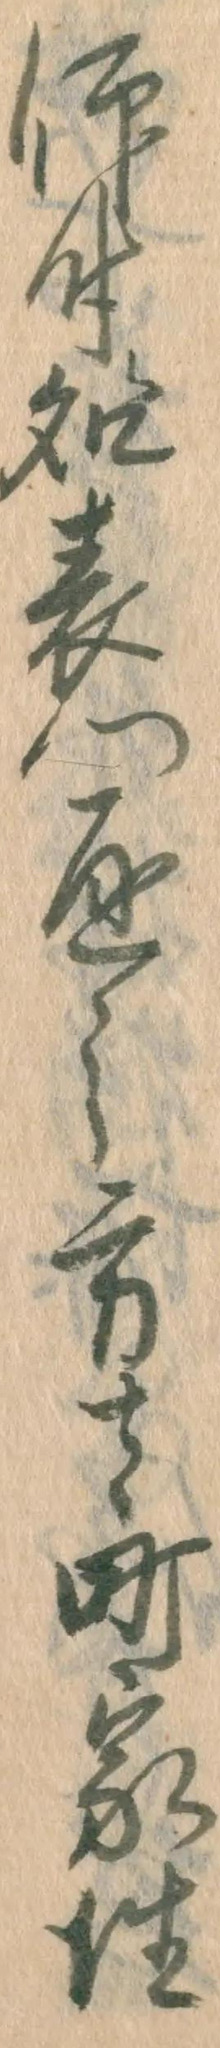仰付候処表門通之方は町家往
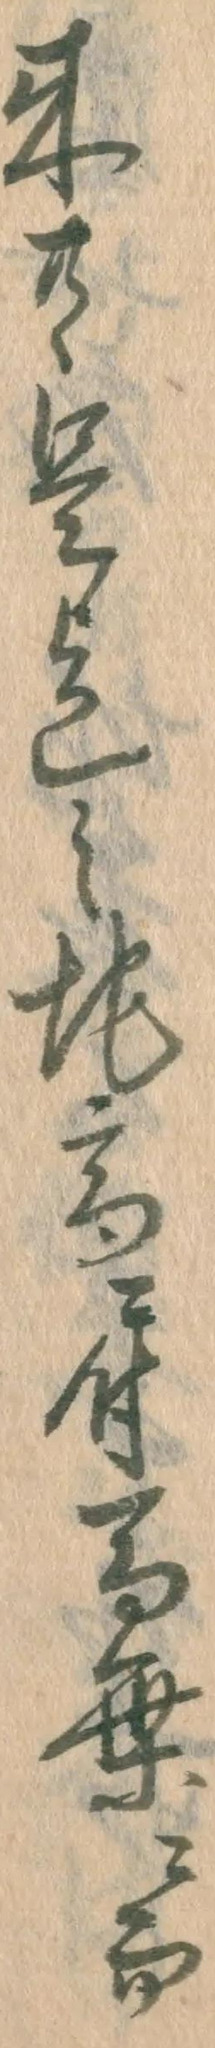来共是迄之地高ニ付馬乗ニて
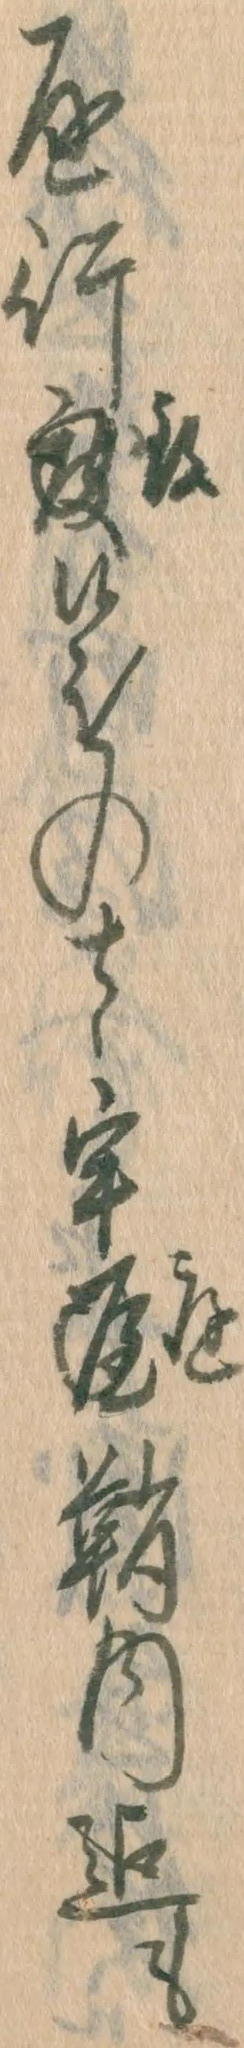通行致候ものは牢通屋鞘内迄も
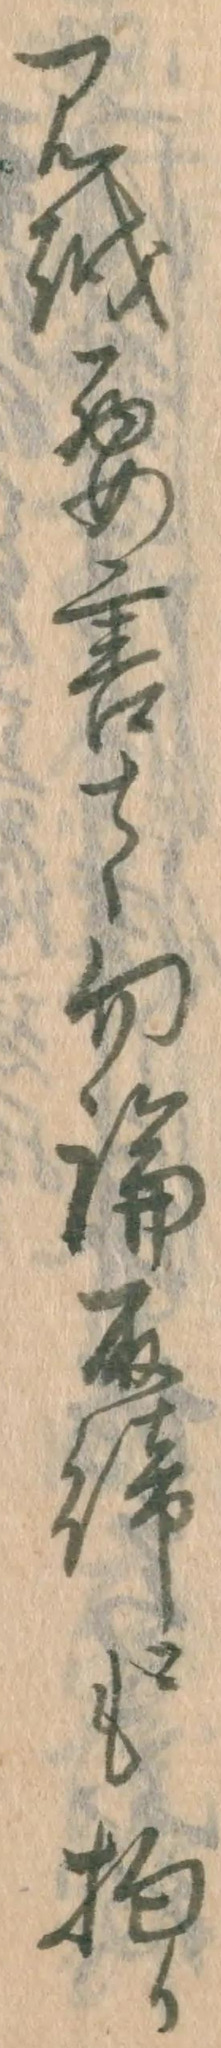見越要害は勿論取締ニも拘り
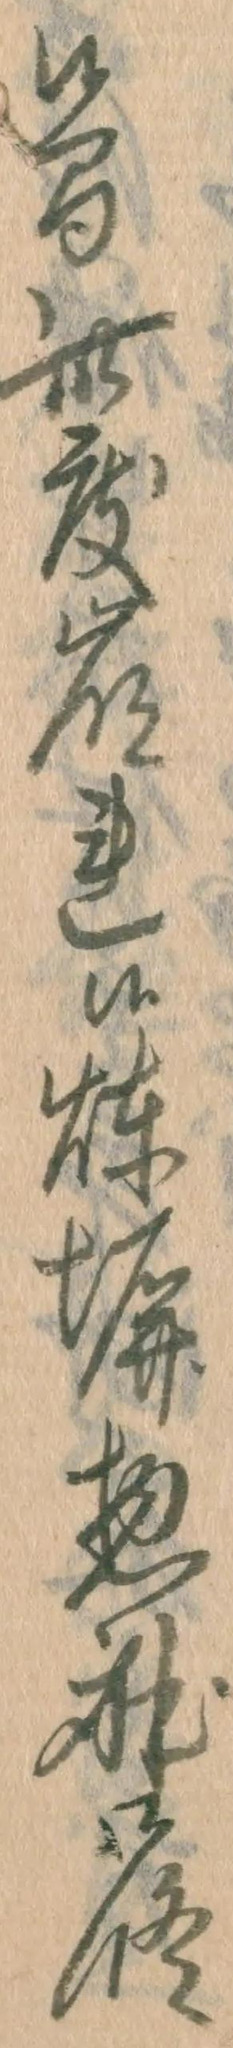候間此度崩れ候煉塀惣体御修
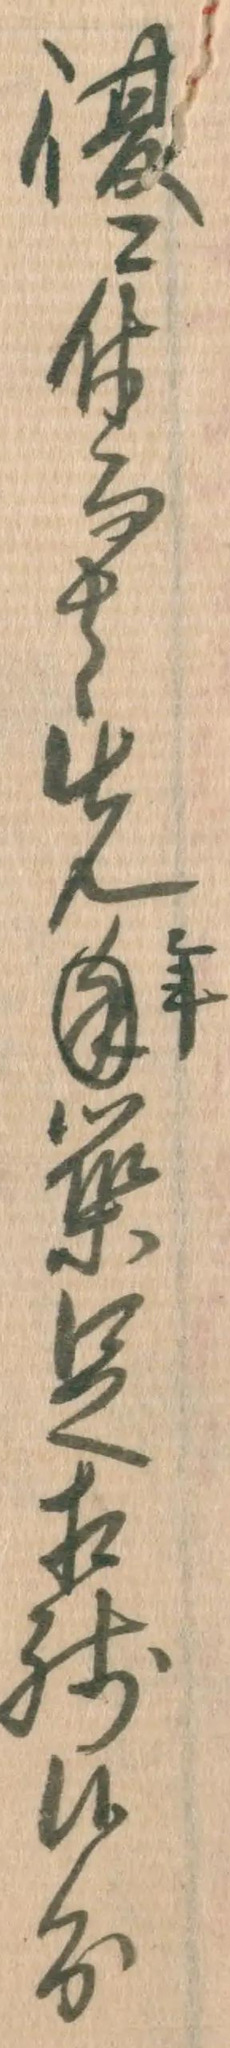復ニ付ては先年築足相残候分
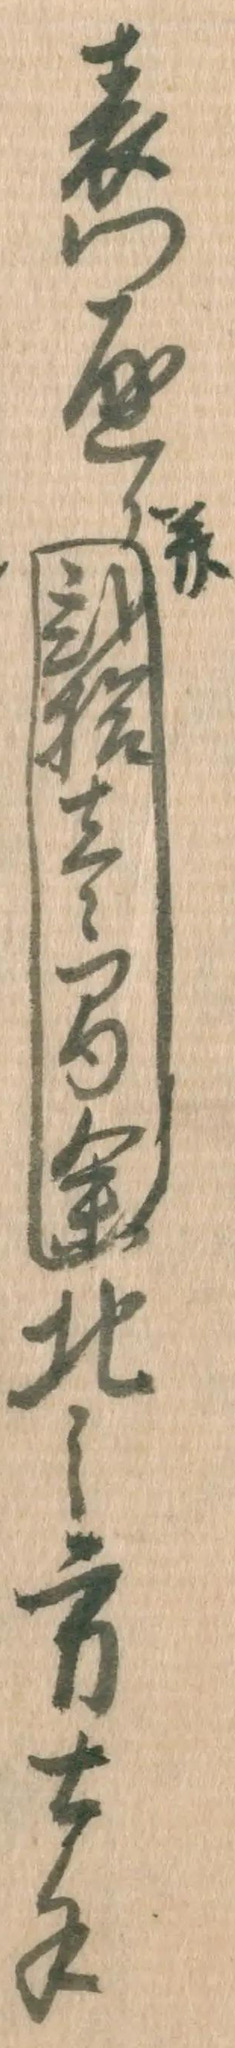表門通弐拾壱間余幷北之方土手
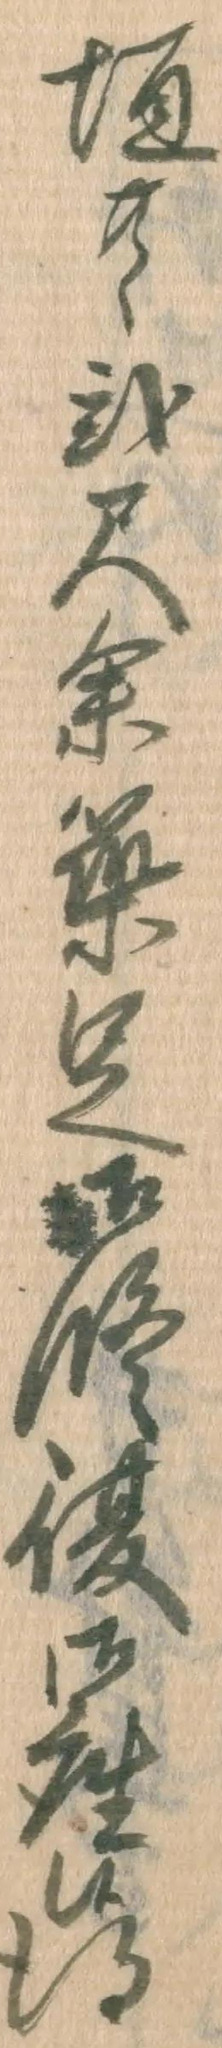垣共弐尺余築足御修復御座候得
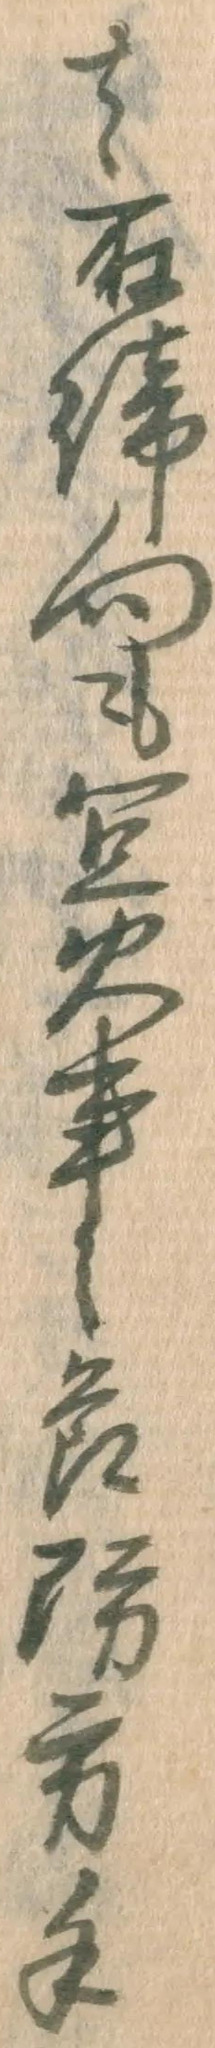は取締向向も宜火事之節防方手
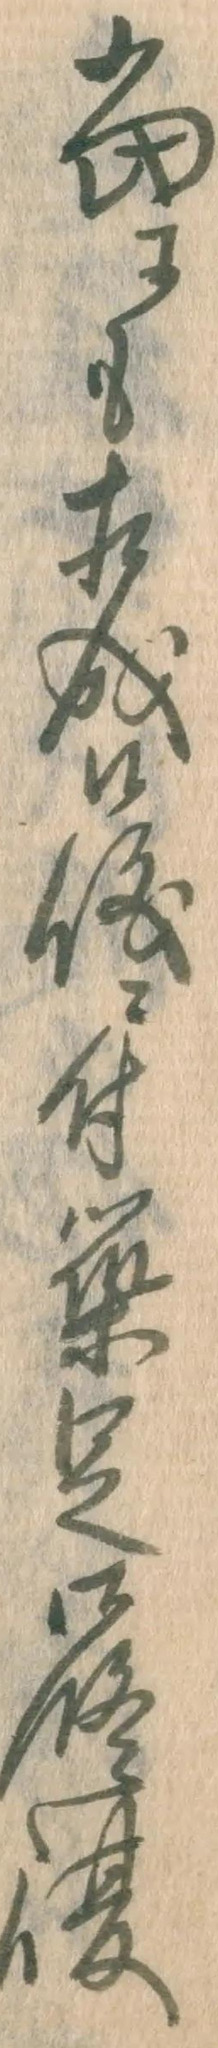当にも相成候儀に付築足御修復

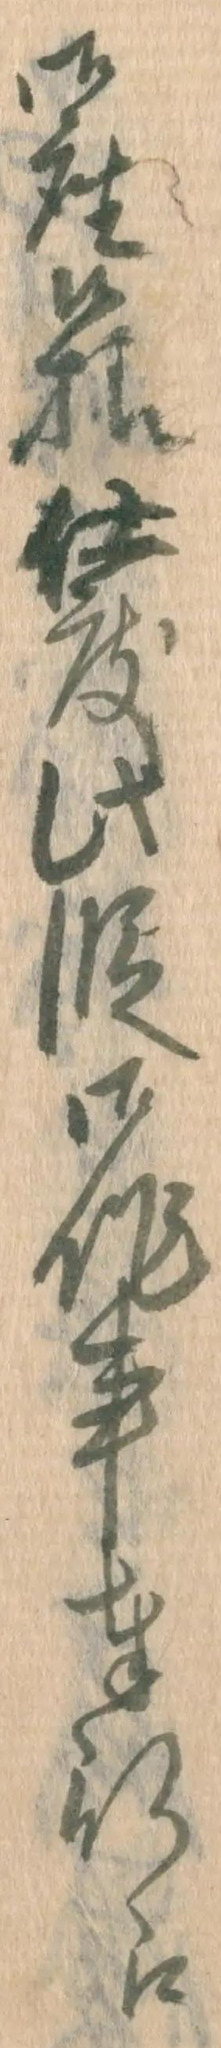御座候様仕度此段御作事奉行え
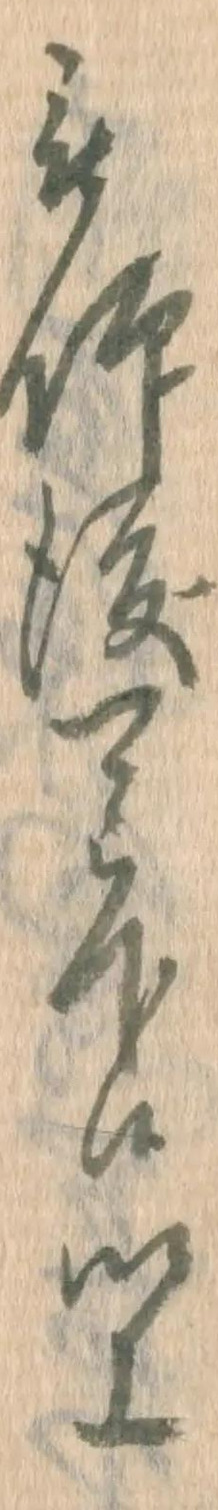被仰渡可被下候以上
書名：七十冊物類集 71巻. [44] 四十三 牢屋敷御普請御修覆地震ニ付骨折候牢屋掛御褒美之部
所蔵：国立国会図書館 National Diet Library, JAPAN
